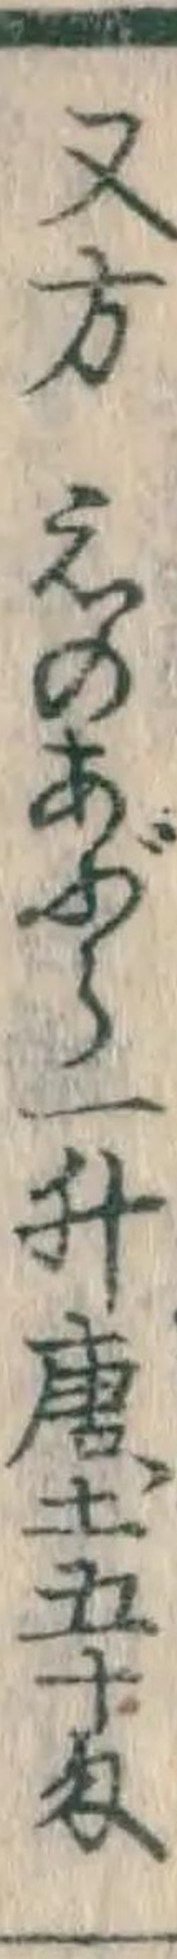又方えのあぶら一升唐土五十匁
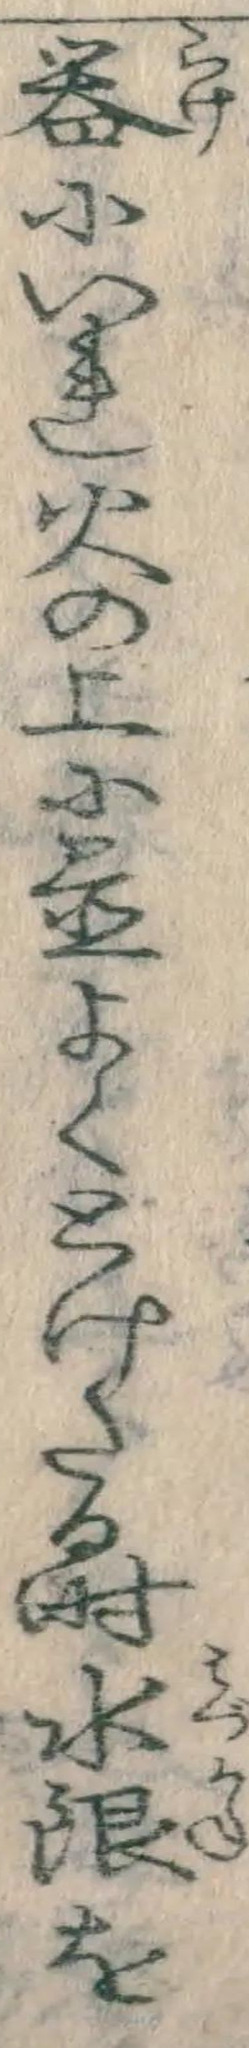器にいれ火の上に置よくとけたる時水銀を

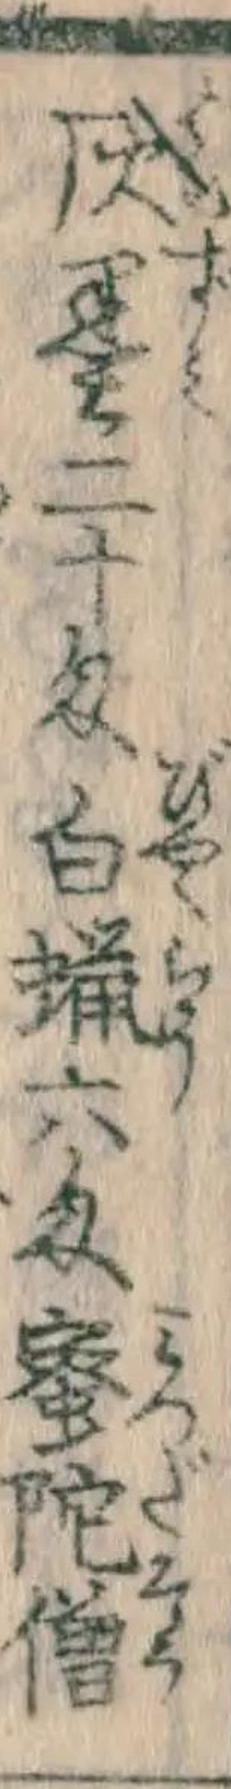灰墨二十匁白蝋六匁蜜陀僧
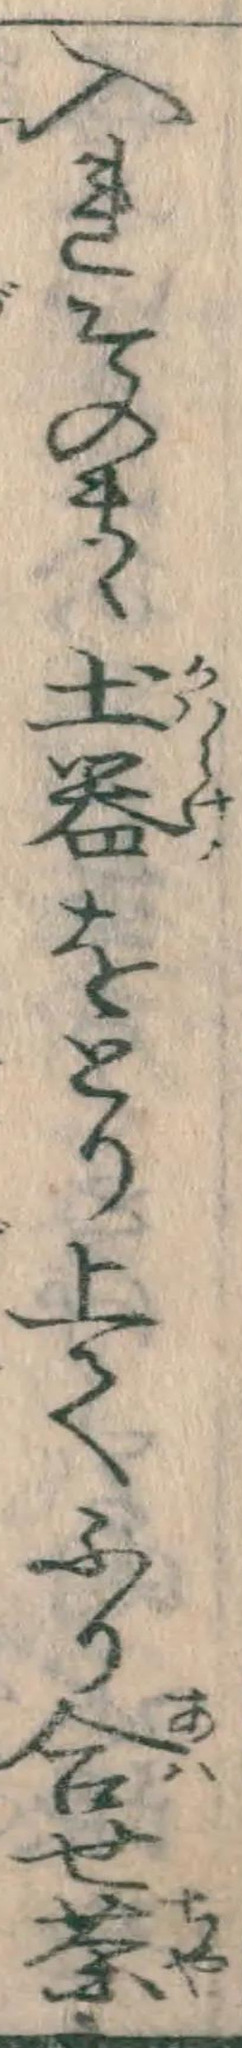入れそのまゝ土器をとり上てふり合せ茶
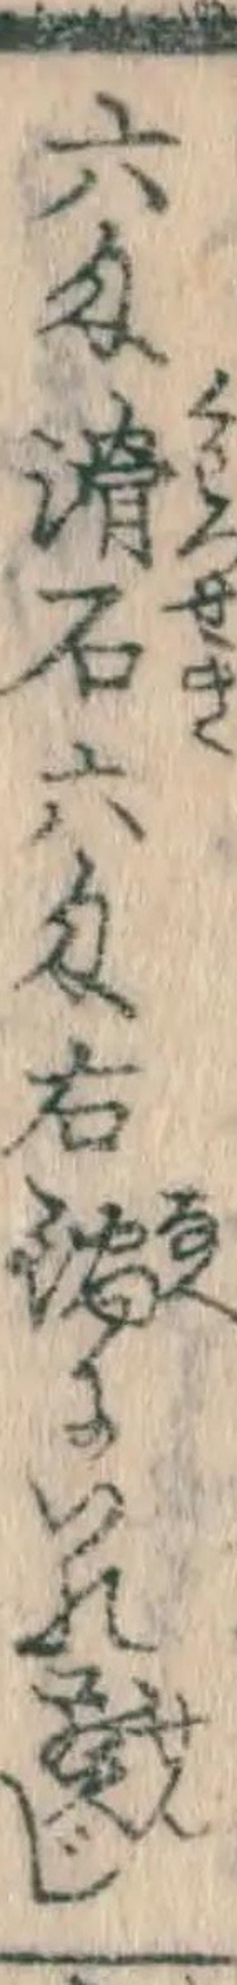六匁滑石六匁右鍋にいれ煎じ
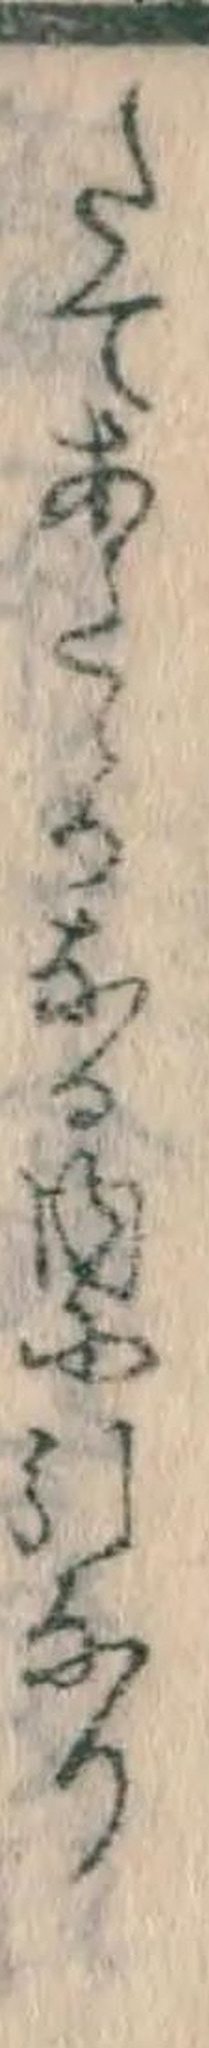たてあたゝかなる内に引なり
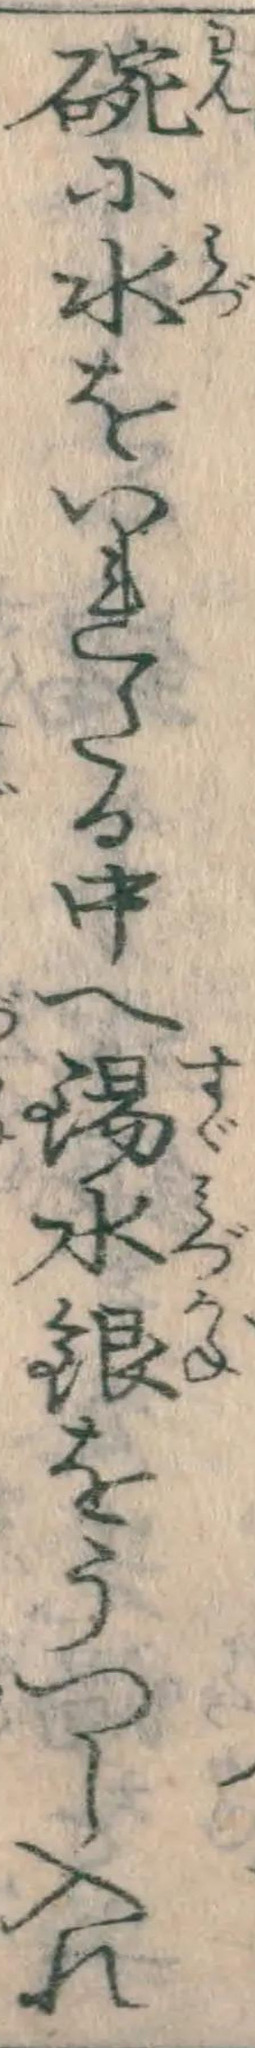碗に水を入れたる中へ錫水銀をうつし入れ
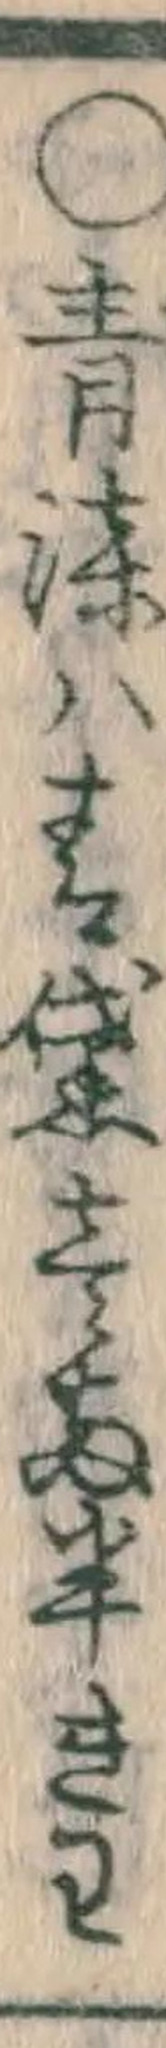○青漆は青黛壱両半きわ
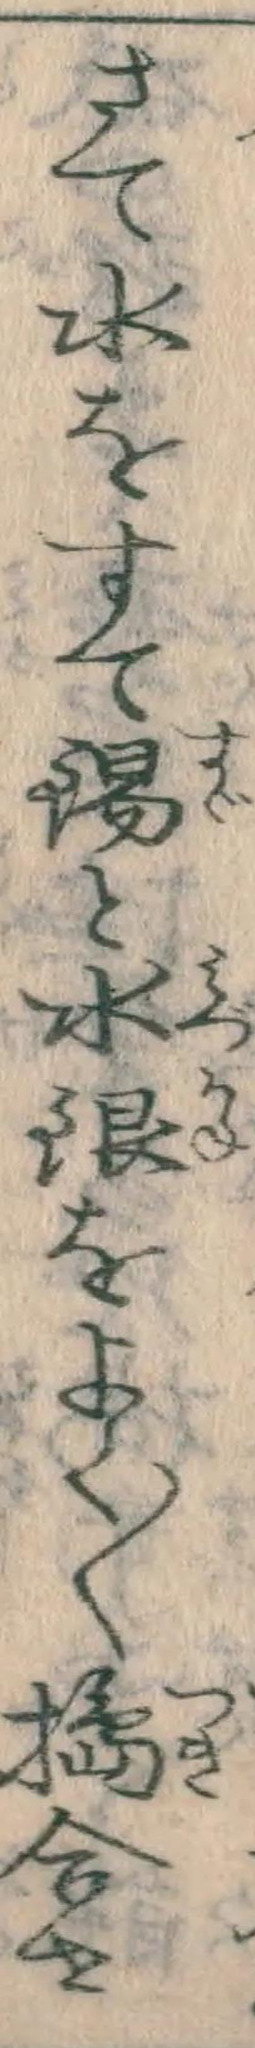さて水をすて錫と水銀をよく〳〵搗合せ
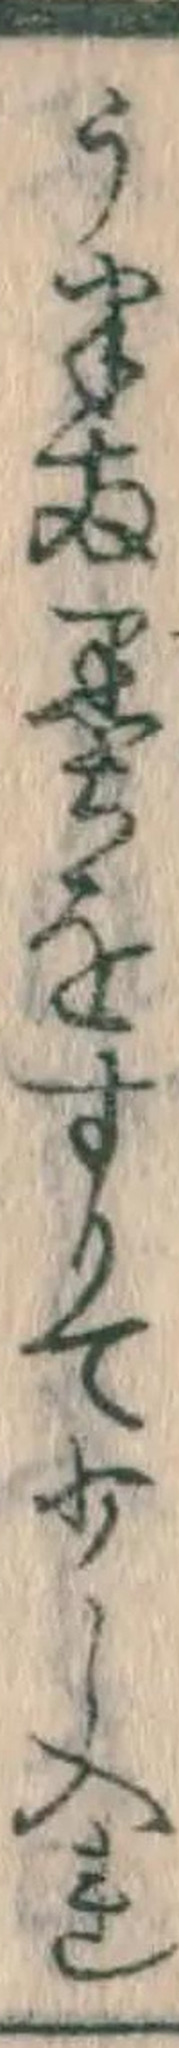う半両墨をすりて少し入れ
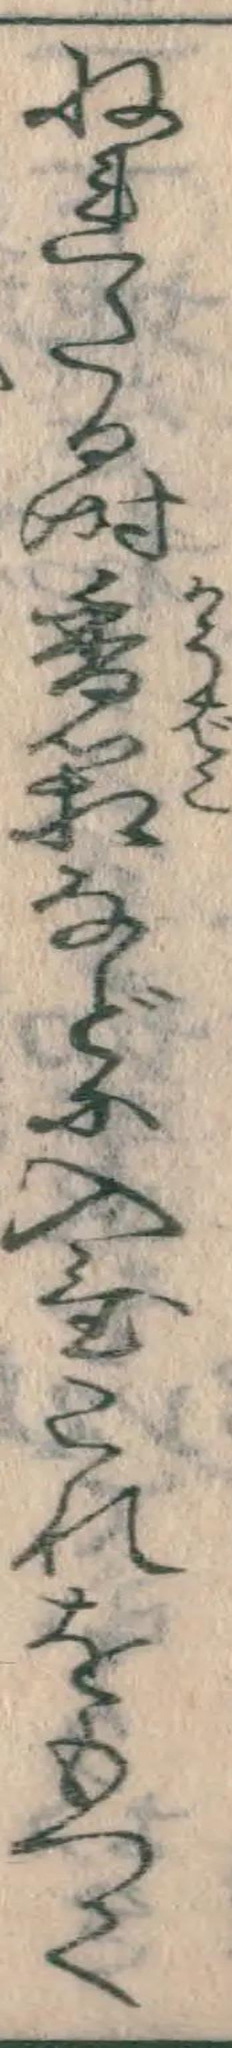ねれたる時香箱などに入置これをもつて
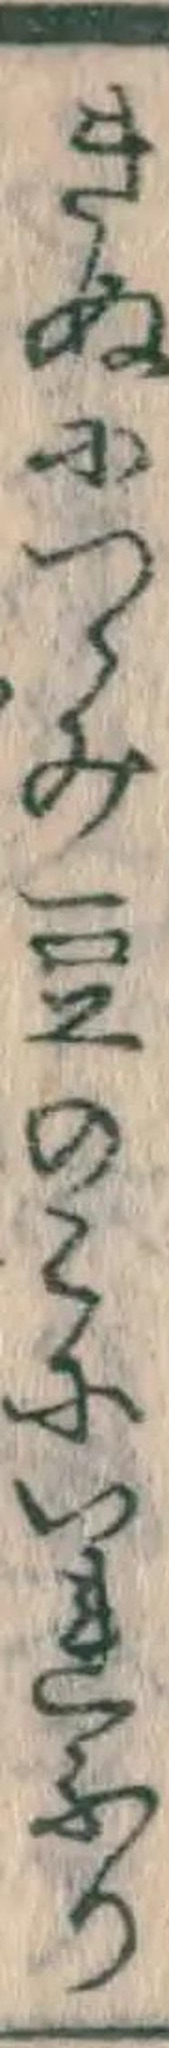きぬにつゝみ豆のこにいれふり
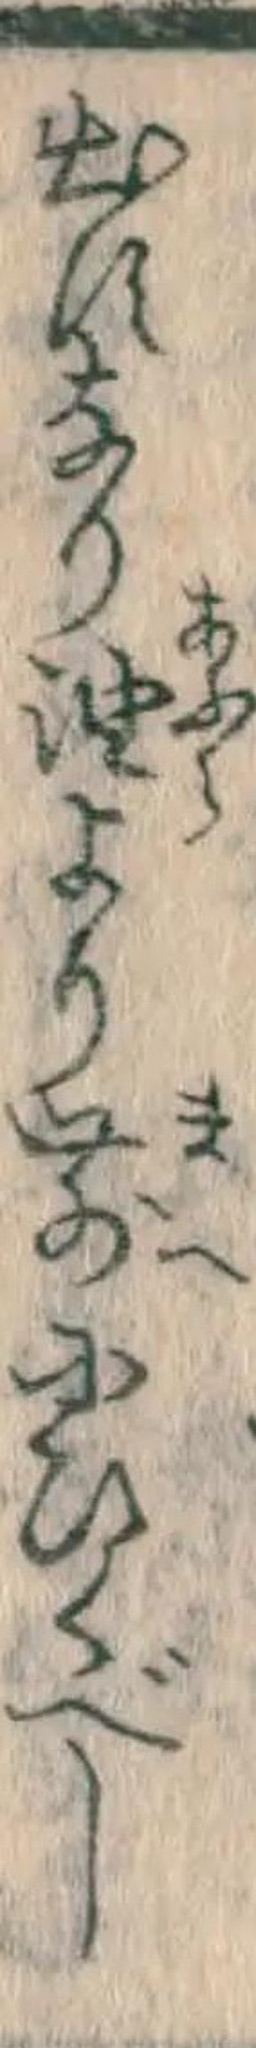出すなり油より前にひくべし
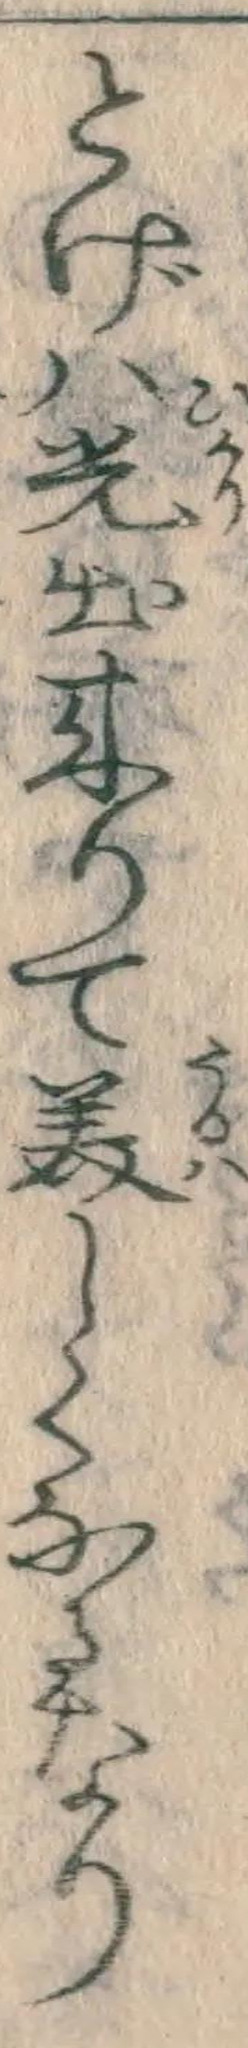とげは光出来りて美しくなるなり
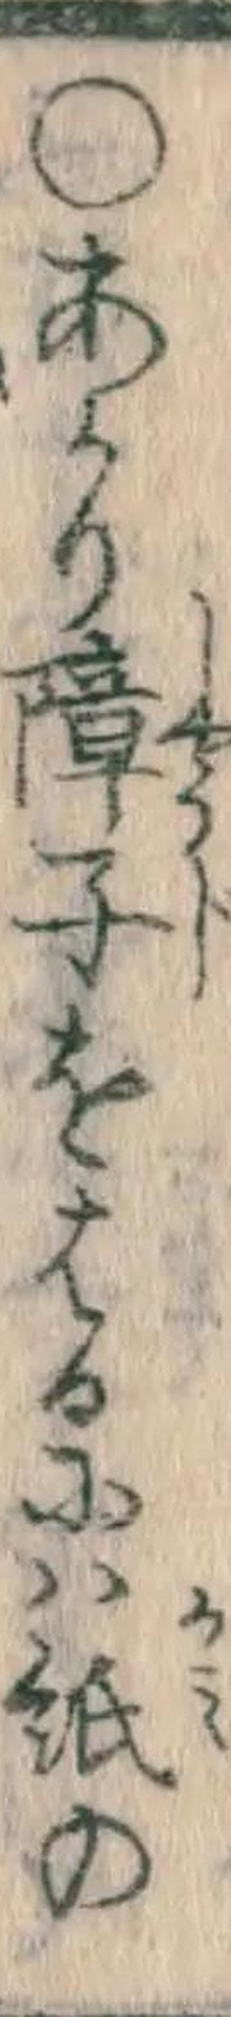○あかり障子をはるには紙の
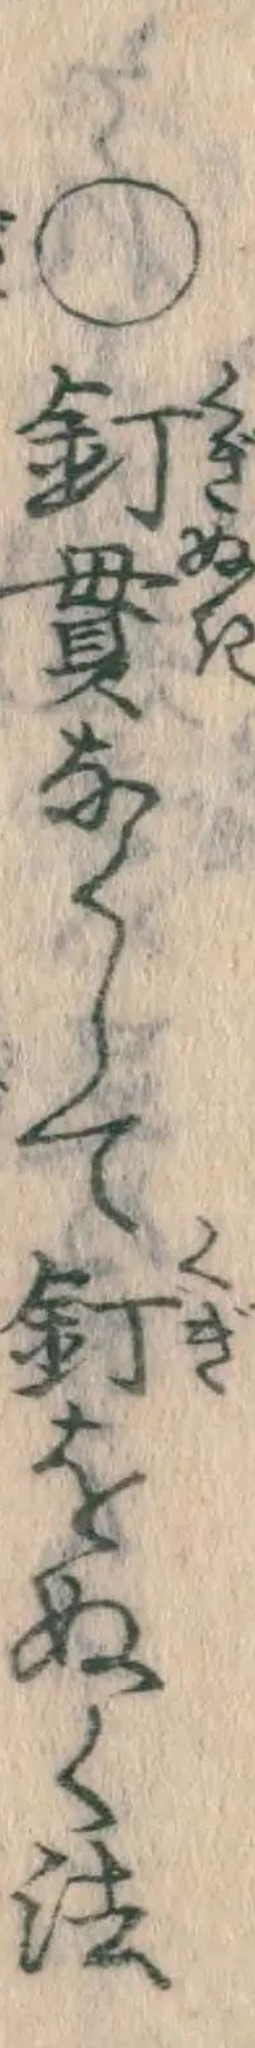○釘貫なくして釘をぬく法
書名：広益秘事大全 3巻. [2]
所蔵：国立国会図書館 National Diet Library, JAPAN
